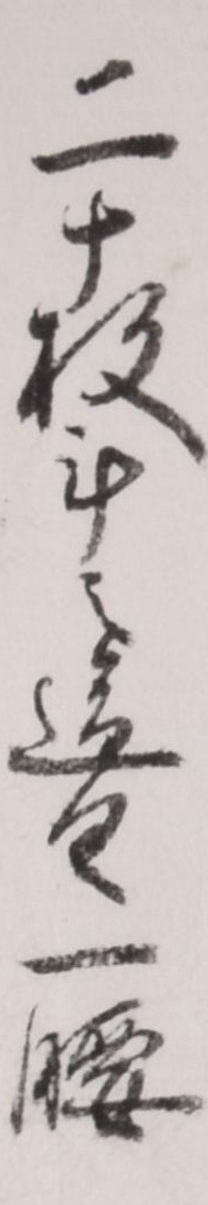二十枚斗之送具一腰
